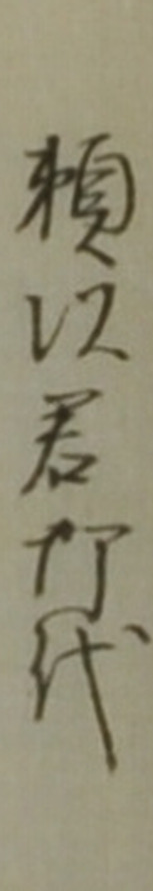頼以君御代
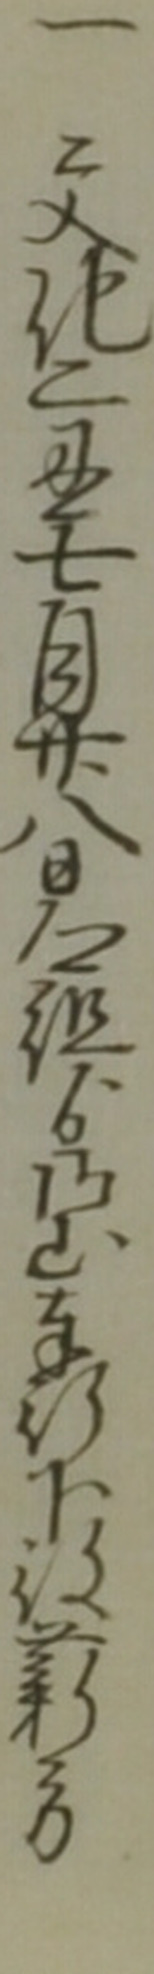一文化二丑七月廿八日郷組ゟ御山奉行下役薪方
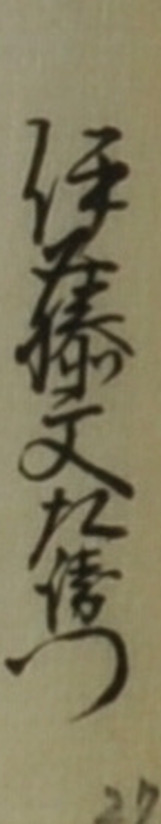伊藤文左衛門
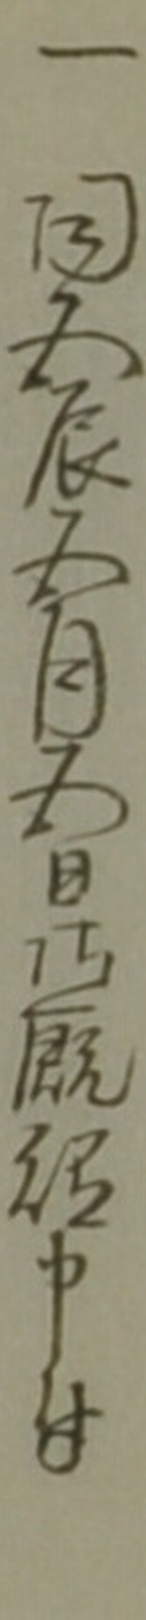一同五辰五月五日御厩賄申付
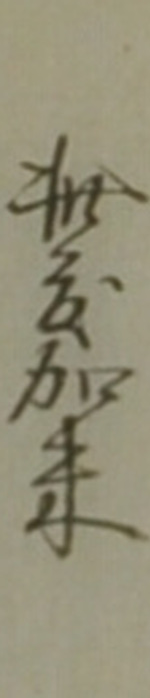此度加米
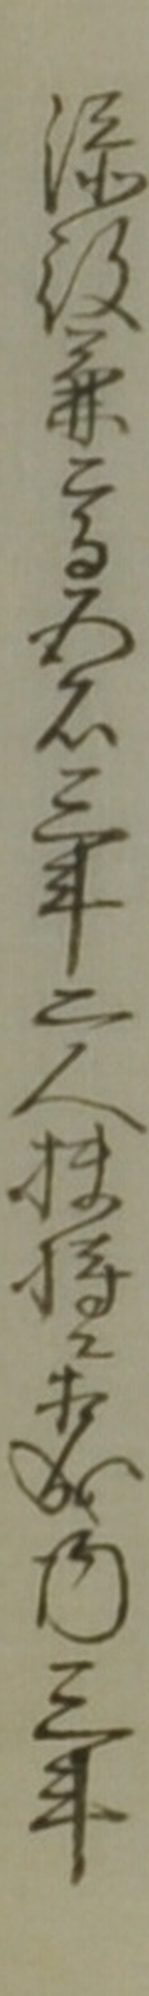添役兼高五石三斗二人扶持ニ相成内三斗
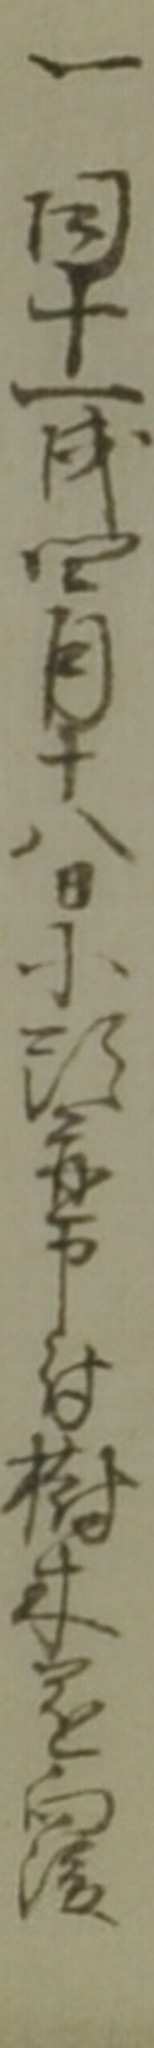一同十一戌四月十八日小頭並申付樹木懸向後
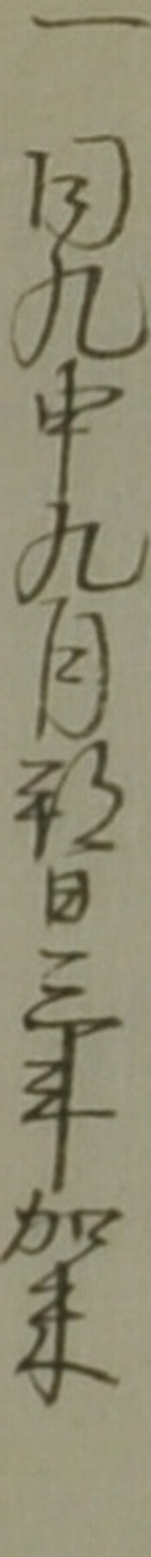一同九申九月朔日三斗加米
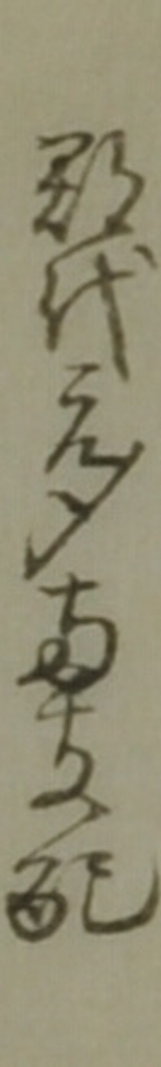郡代元〆両支配
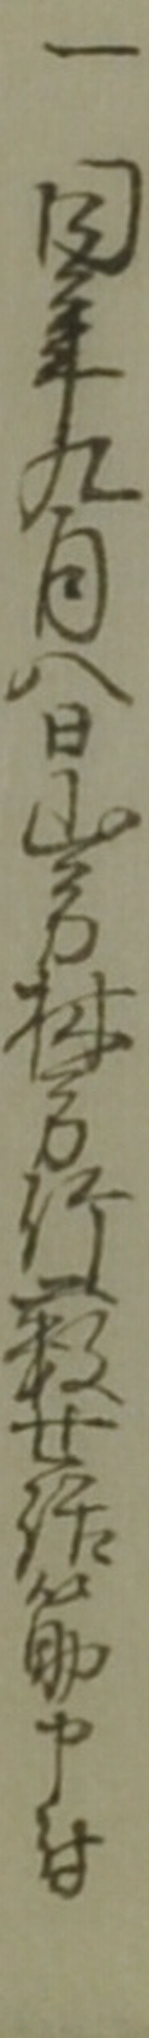一同年九月八日山方林方竹薮世話筋申付
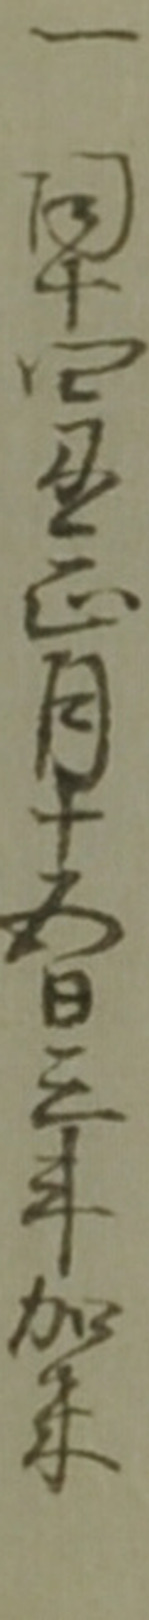一同十四丑正月十五日三斗加米
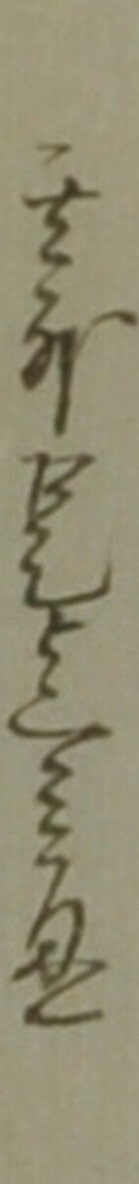其外是迄之通
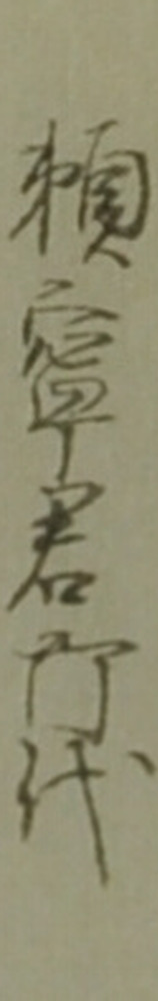頼寧君御代
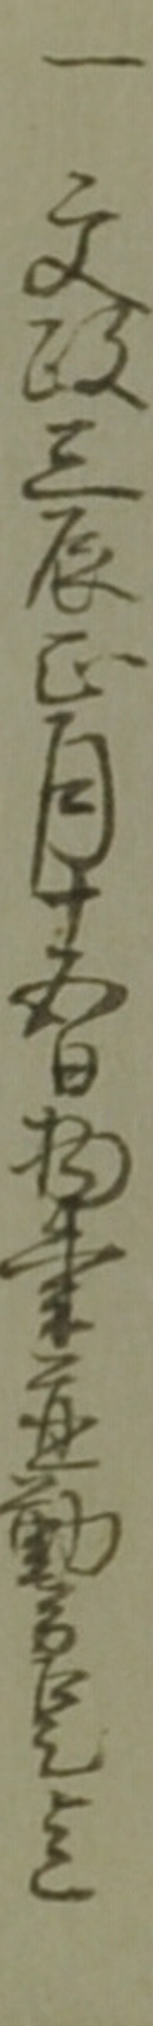一文政三辰正月十五日物書並勤方是迄
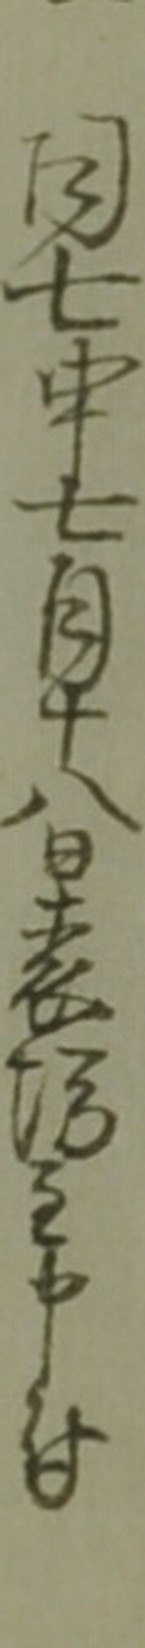一同七申七月十八日表坊主申付
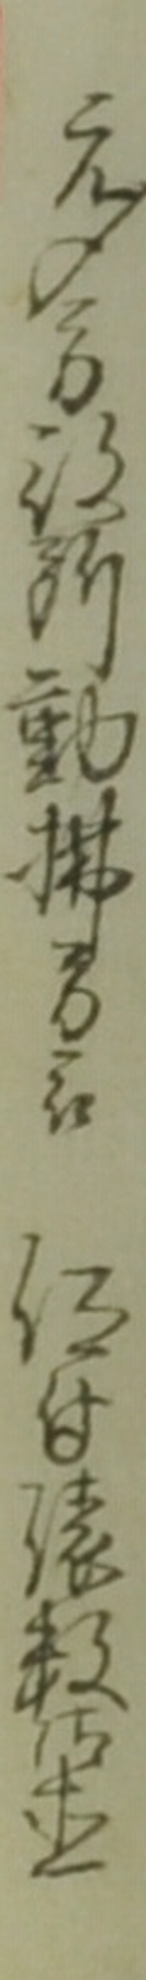元〆方役所勤払方被仰付俵数御直
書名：無足諸士勤仕録（七）
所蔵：伊那市立高遠町図書館・合同会社AMANE
